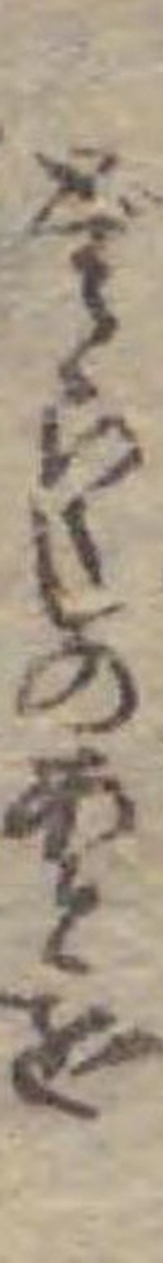どうらくしのあとを
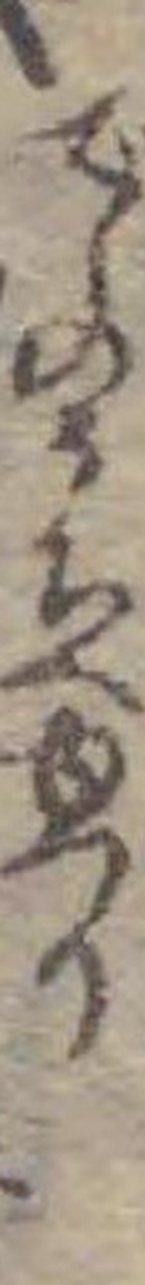でしのうちへゆつり
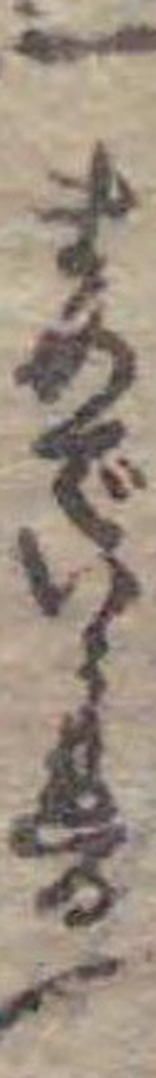まめでいられる
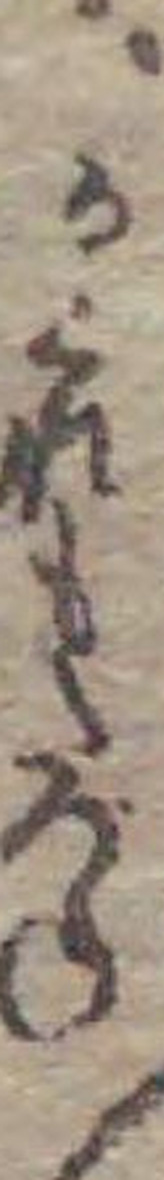かれもたつね
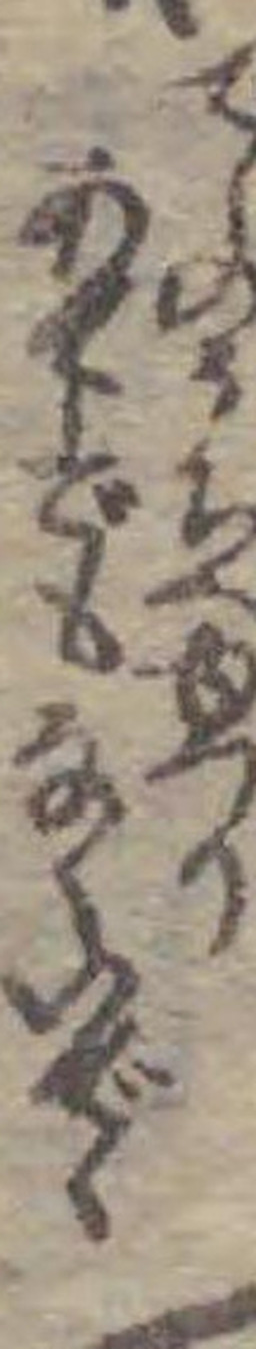あてどもなくいでゝ

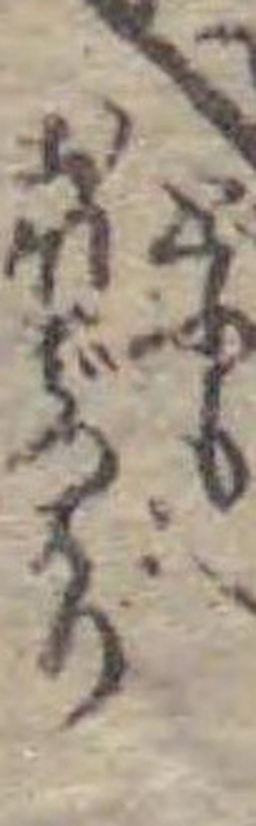おればつかり
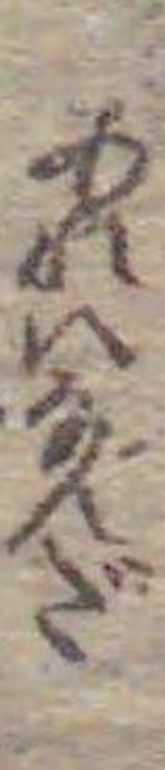あれはなんだ
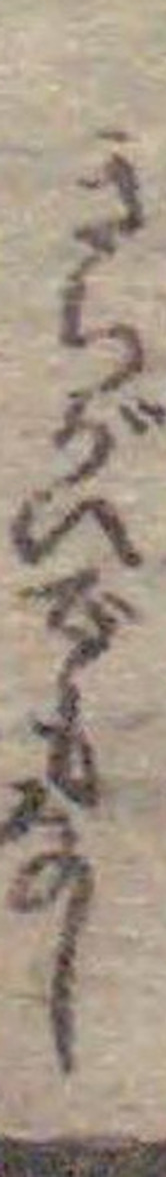きちがいでもなし
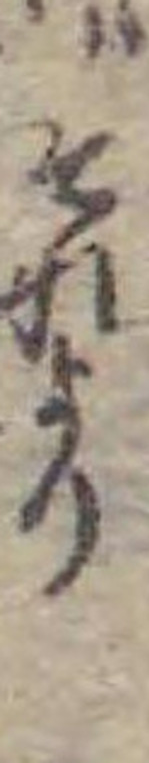それより
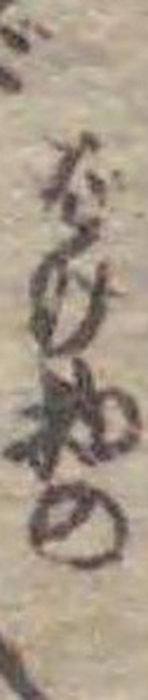ばけ物の
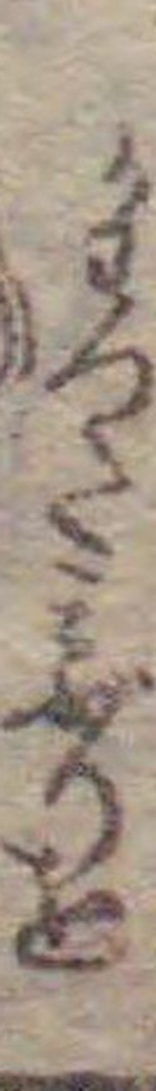かわつたみぶりを
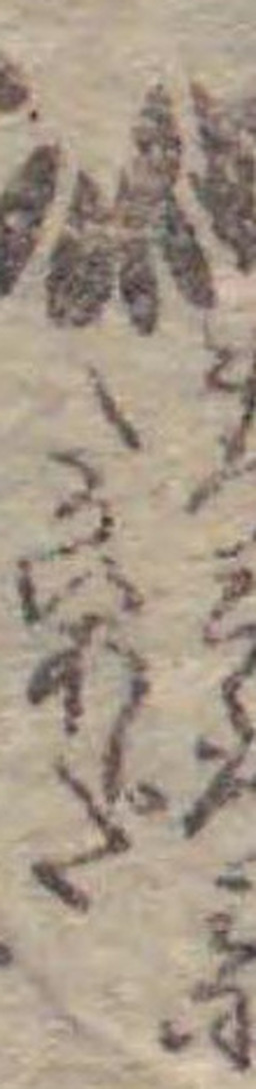たかいあしだ
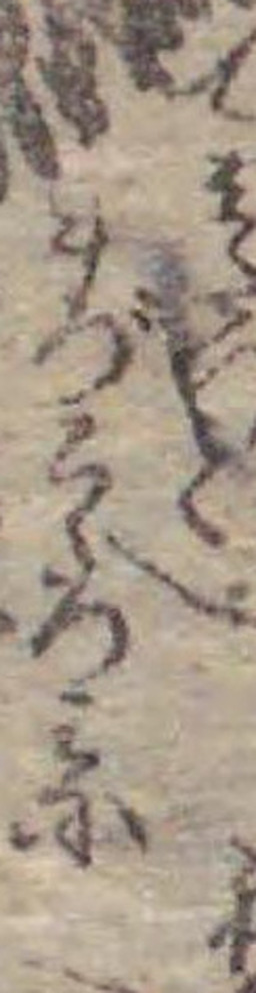まづこゝろみに
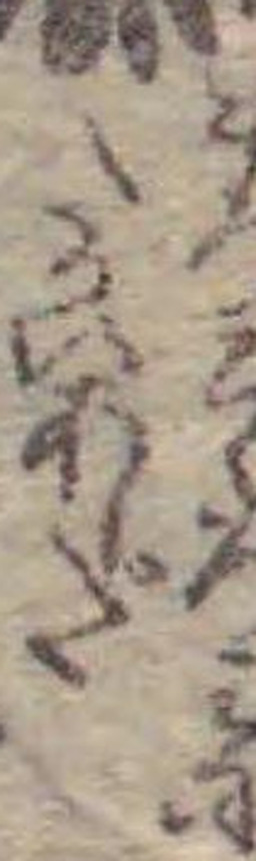たかいあしだ
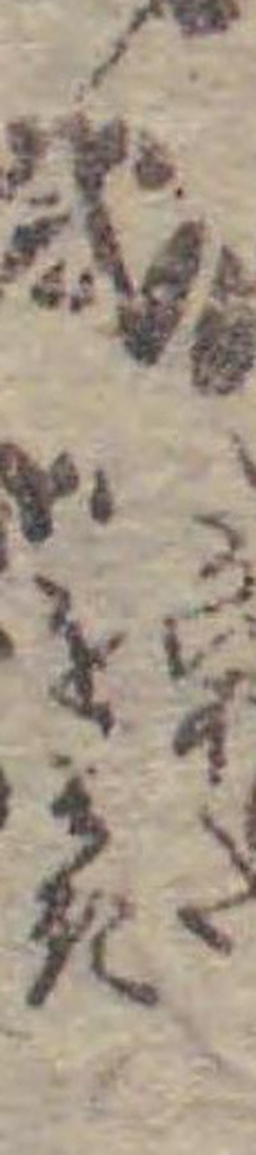をはき
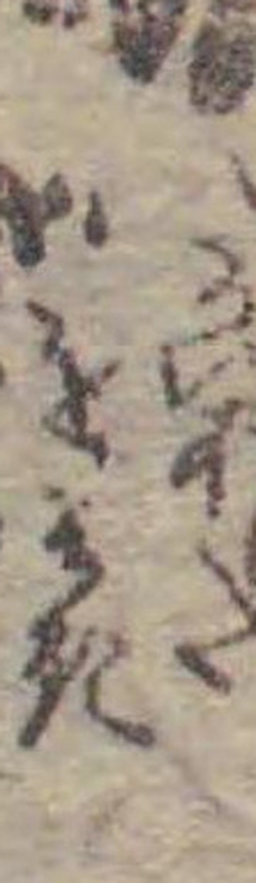をはき
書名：[化物一代記] : 5巻
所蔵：国立国会図書館 National Diet Library, JAPAN
